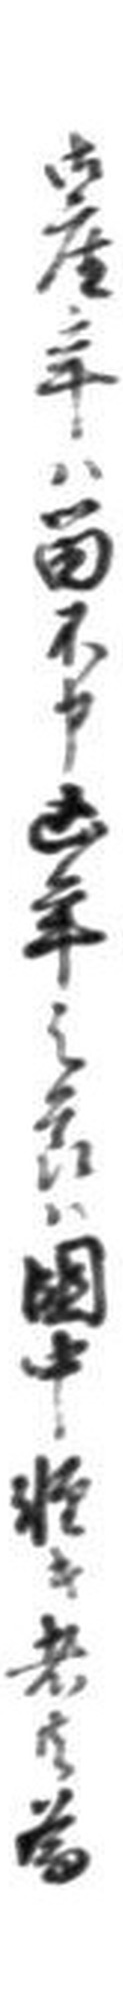御座年ハ留不申凶年之節ハ国中軽キ者共為
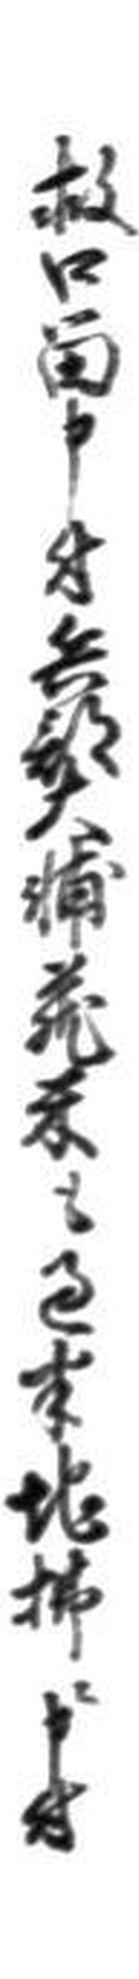救口留申付兵部大輔蔵米も過半地払ニ申付

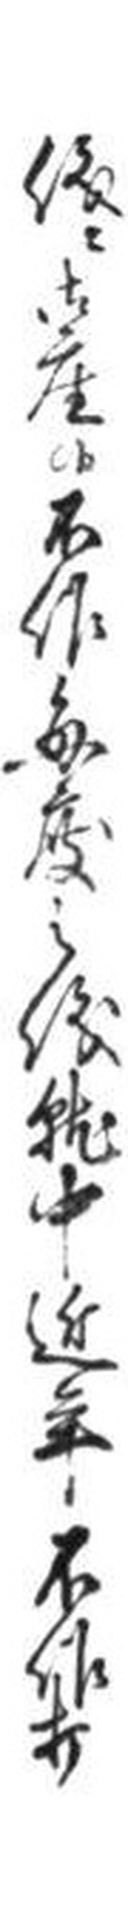儀ニ御座候不作毎度之儀就中近年不作打
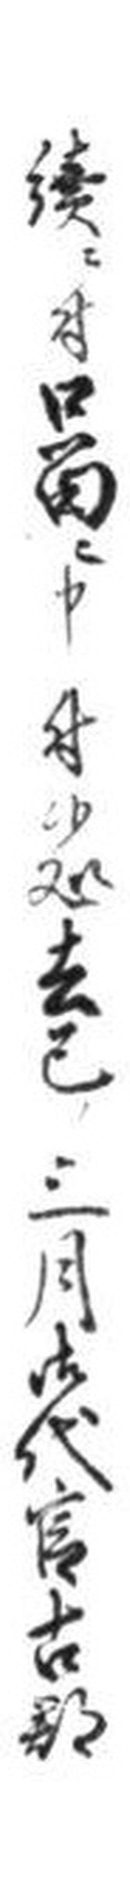続ニ付口留ニ申付候処去巳ノ三月御代官古郡
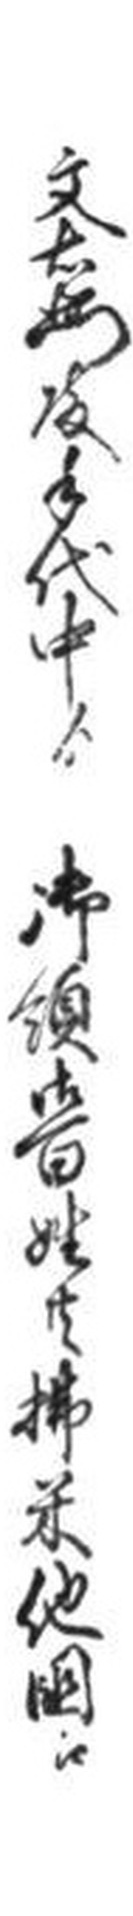文右衛門殿手代中ゟ御領御百姓共払米他国江
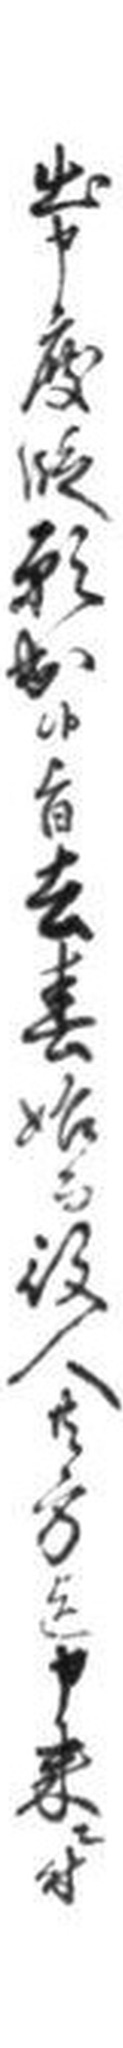出申度段願出候旨去春始而役人共方迄申来ニ付
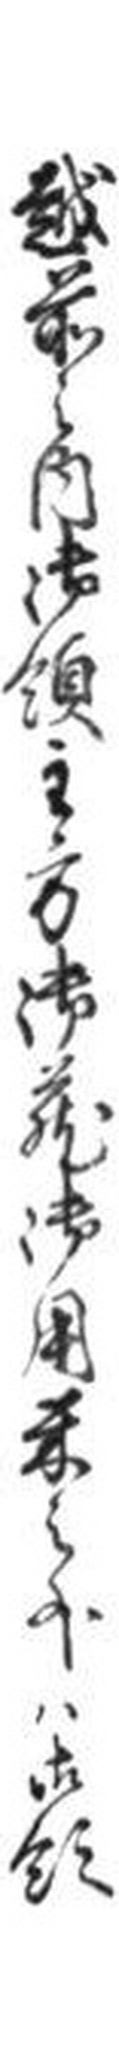越前之内御領主方御蔵御用米之外ハ御領
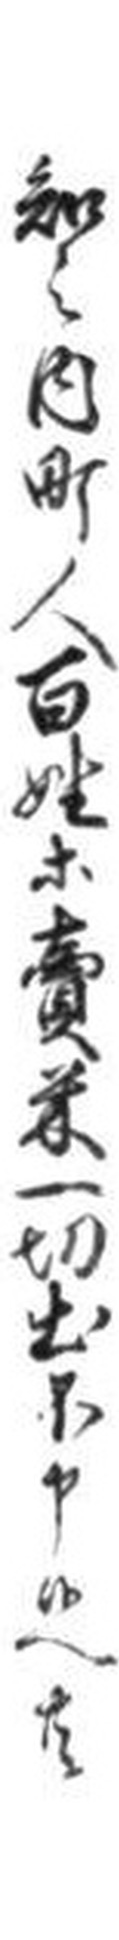知之内町人百姓等売米一切出不申候へ共
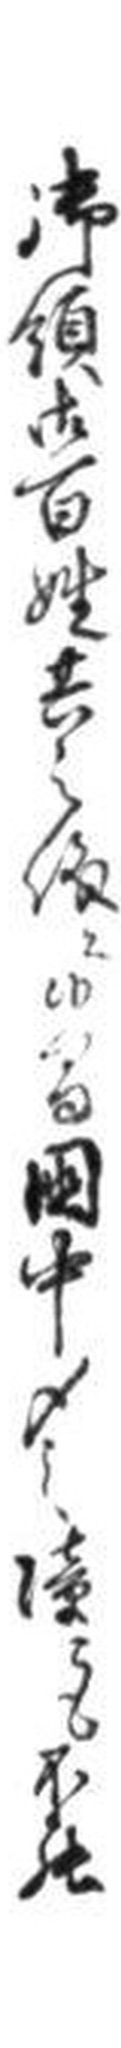御領御百姓共之儀ニ候間国中〆之障ニも不罷
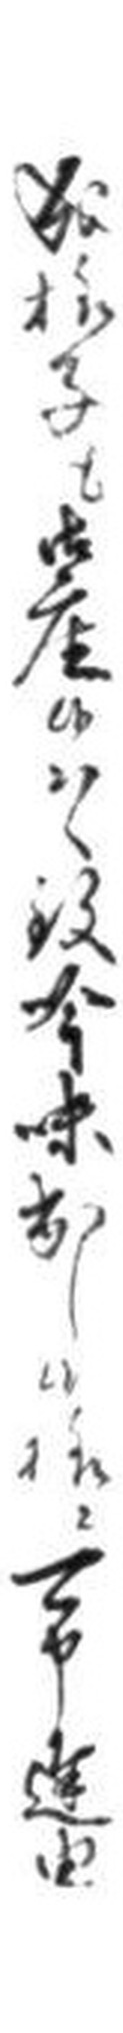成様子も御座候ハヽ致吟味出し候様ニ可申達由
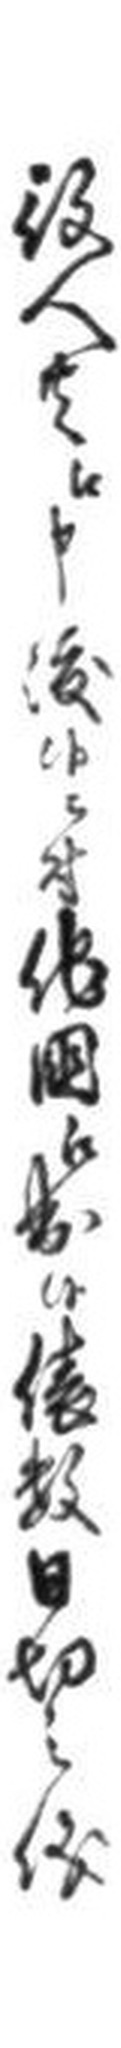役人共江申渡候ニ付他国江出候俵数日切之儀
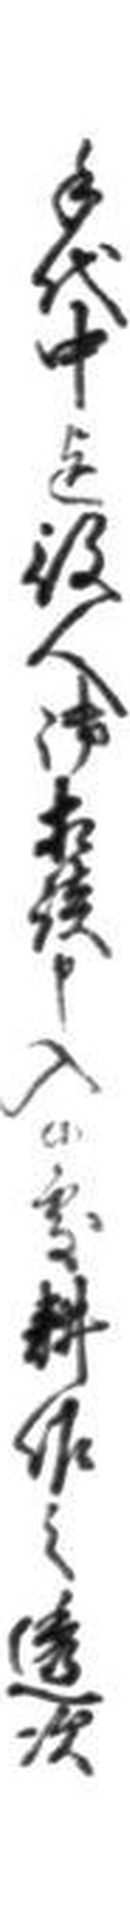手代中迄役人御相談申入候処耕作之透次
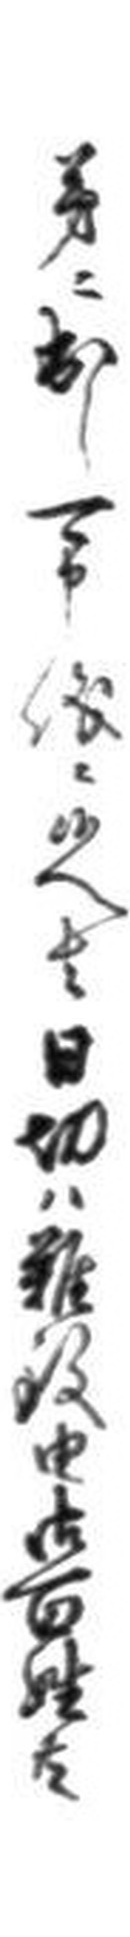第ニ出し可申儀ニ候へ者日切ハ難致由御百姓共
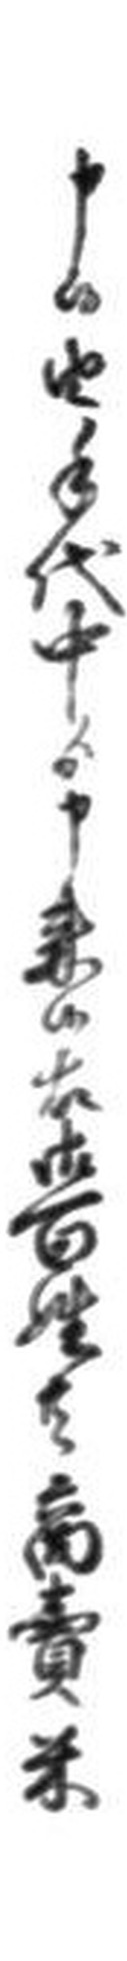申候由手代中ゟ申来候故御百姓共商売米
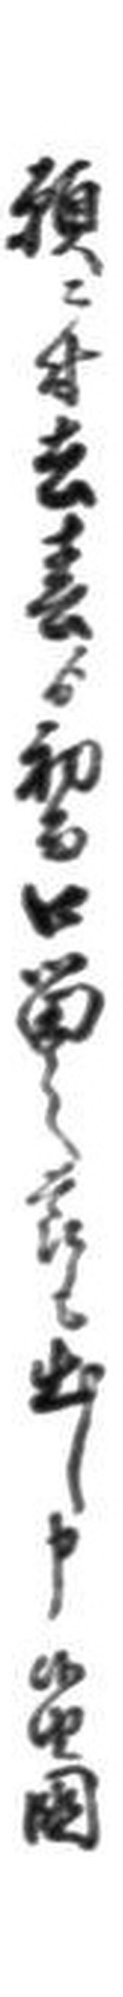願ニ付去春ゟ初而口留之節も出し申候由国
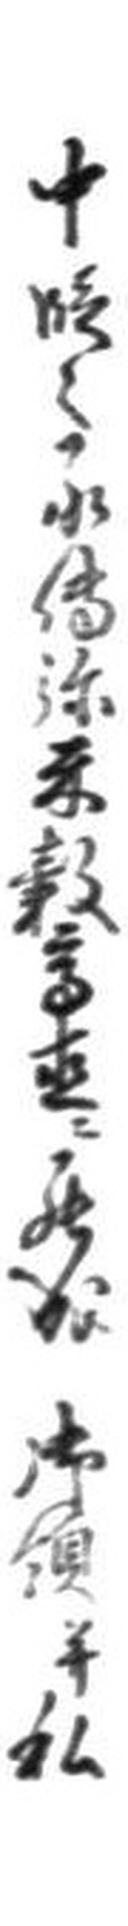中段々承伝弥米穀高直ニ罷成御領并私
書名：家譜 二十二 吉品公 従元禄十五年到同十六年
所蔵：福井県文書館 Fukui Prefectural Archives
